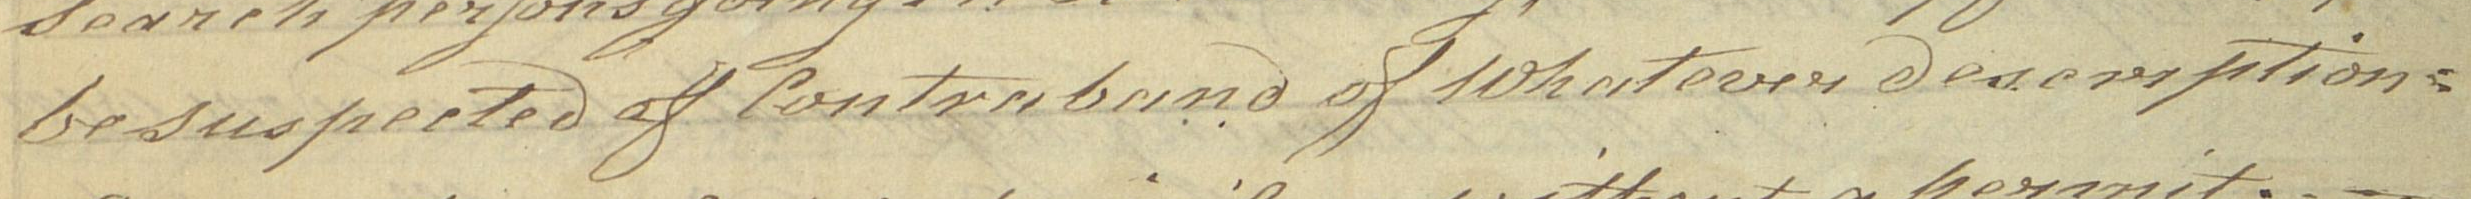be suspected of Contraband of Whatever description
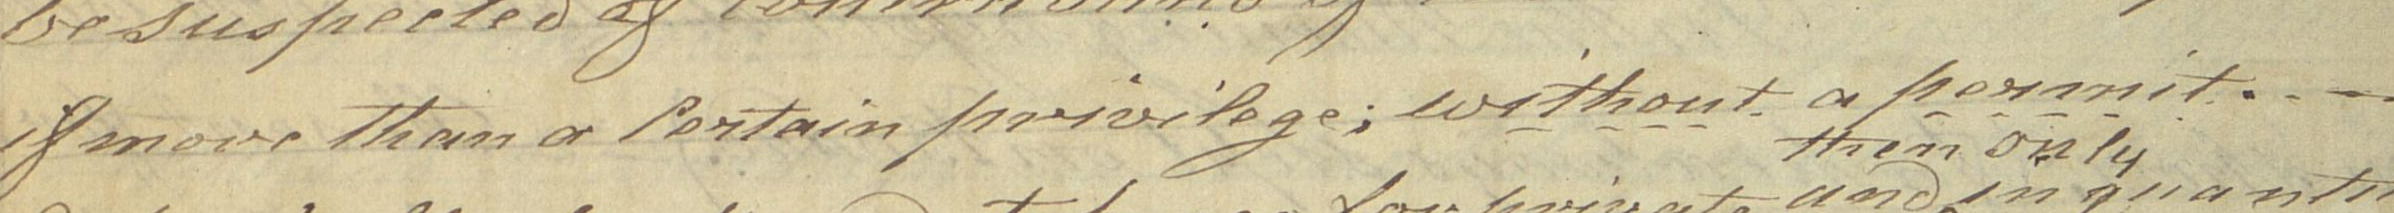if move than a Certain privilege; without a permit.
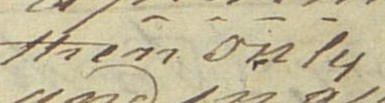then only
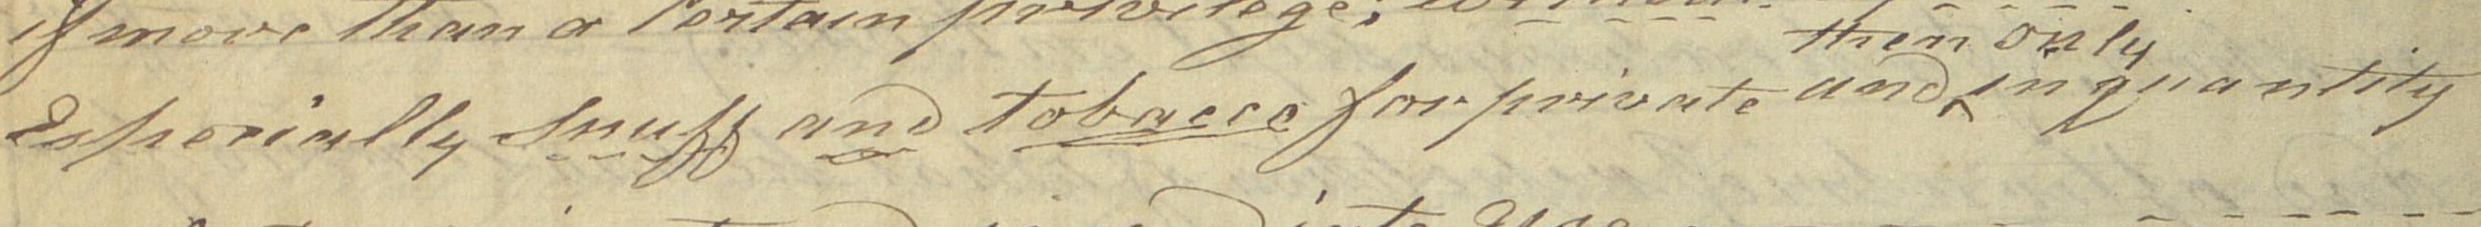Especially snuff and tobacco for private and ^ in quantity
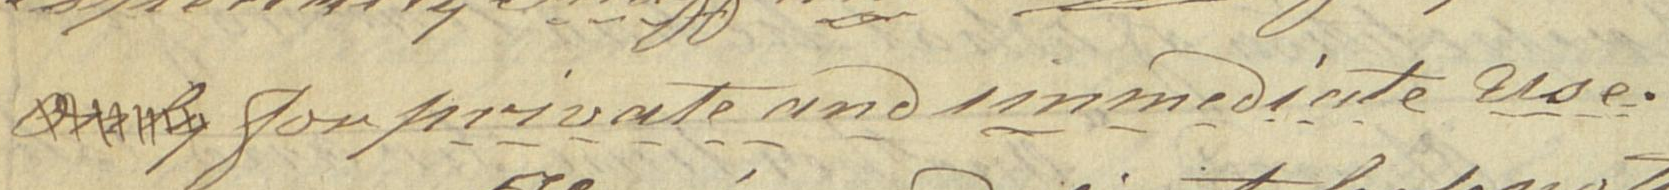only for private and immediate use.
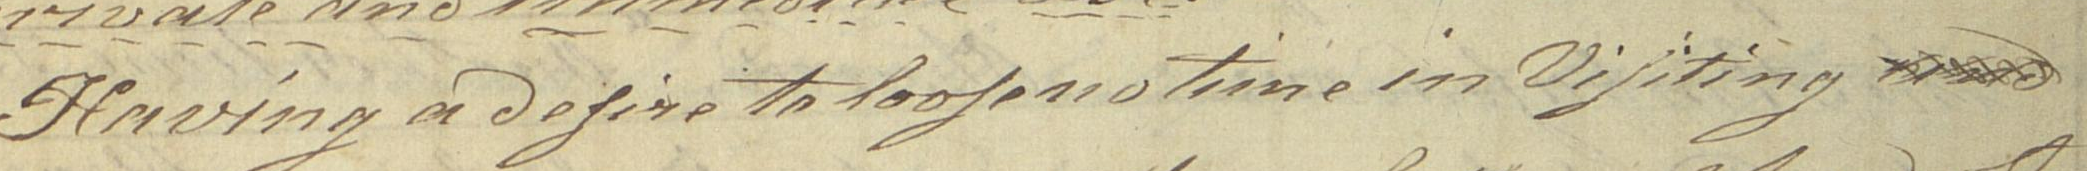Having a desire to loose no time in Visiting and
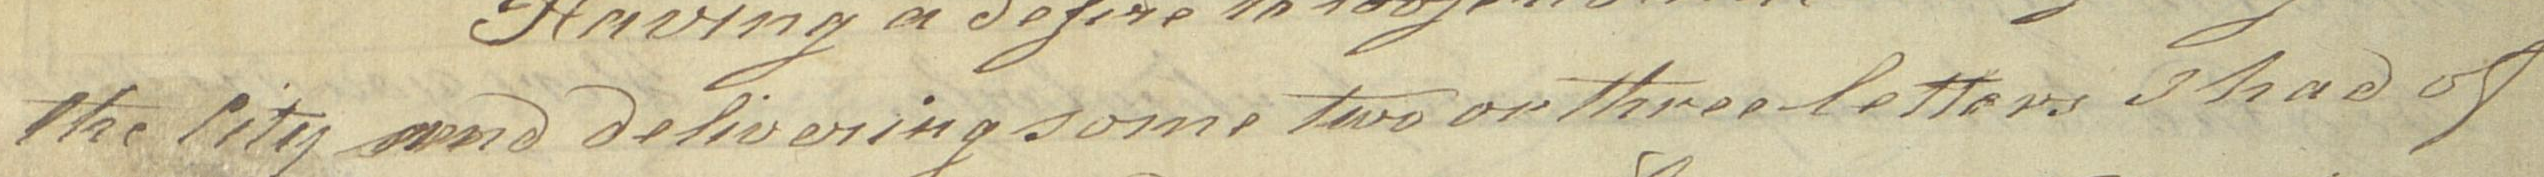the City and delivering some two or three letters I had of
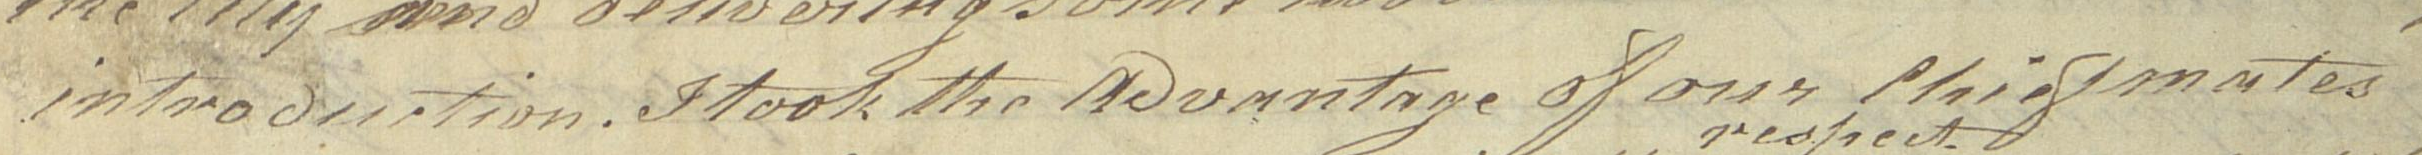introduction. I took the Advantage of our Chief mates
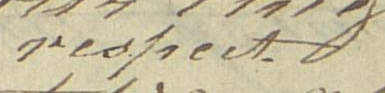respect.
